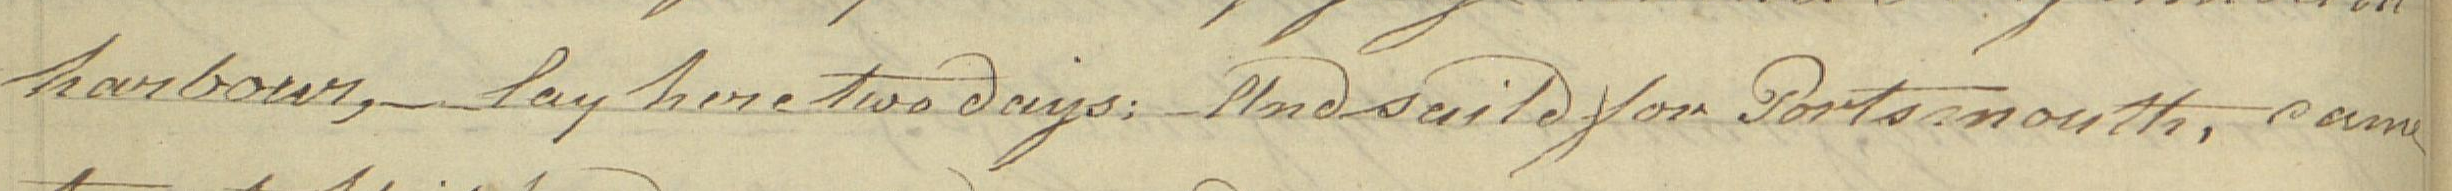harbour, lay here two days: And saild for Portsmouth, came
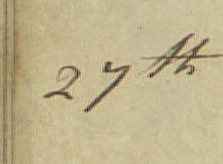27^th
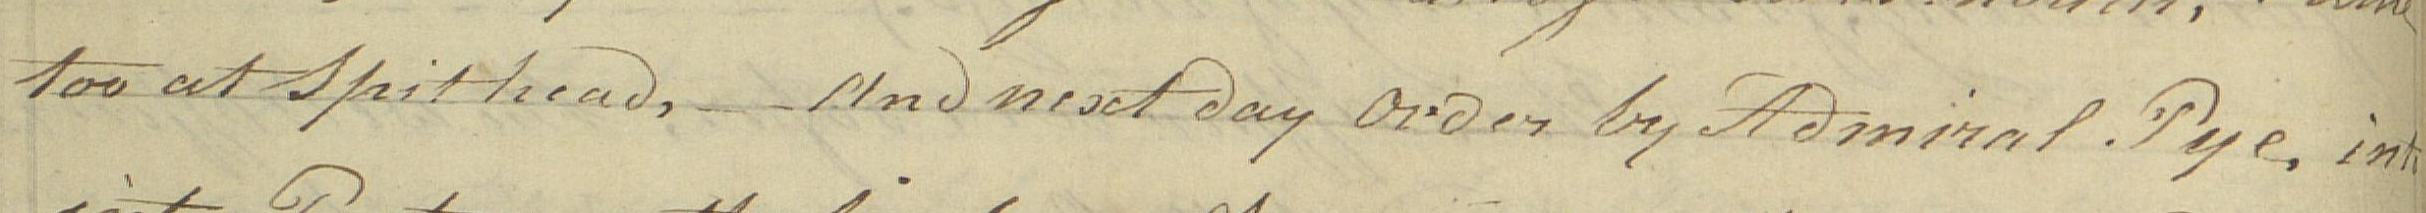too at Spithead, And next day Order by Admiral Pye, into
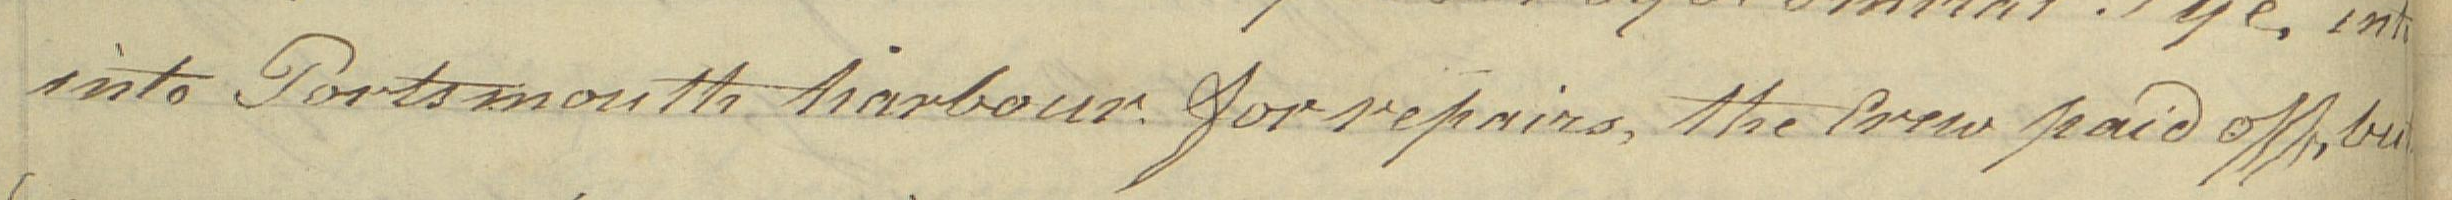into Portsmouth harbour for repairs, the Crew paid off, but
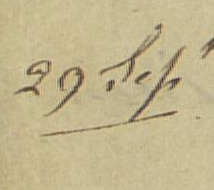29 Sep^r
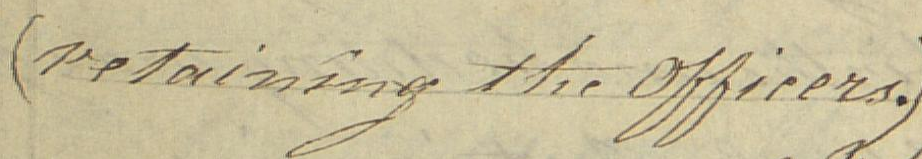(retaining the Officers.)
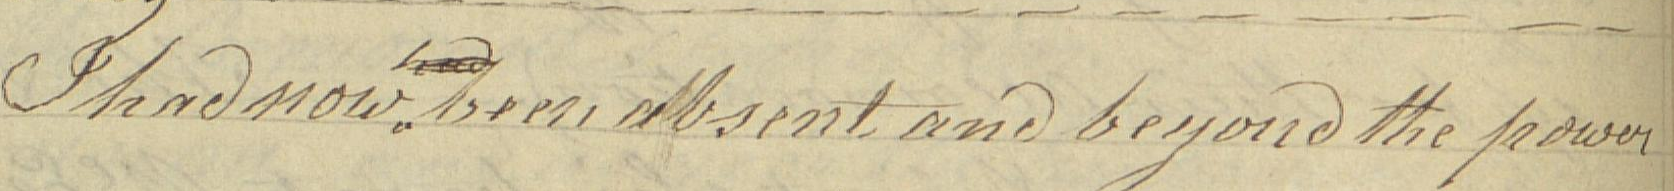I had now ^ been absent and beyond the power
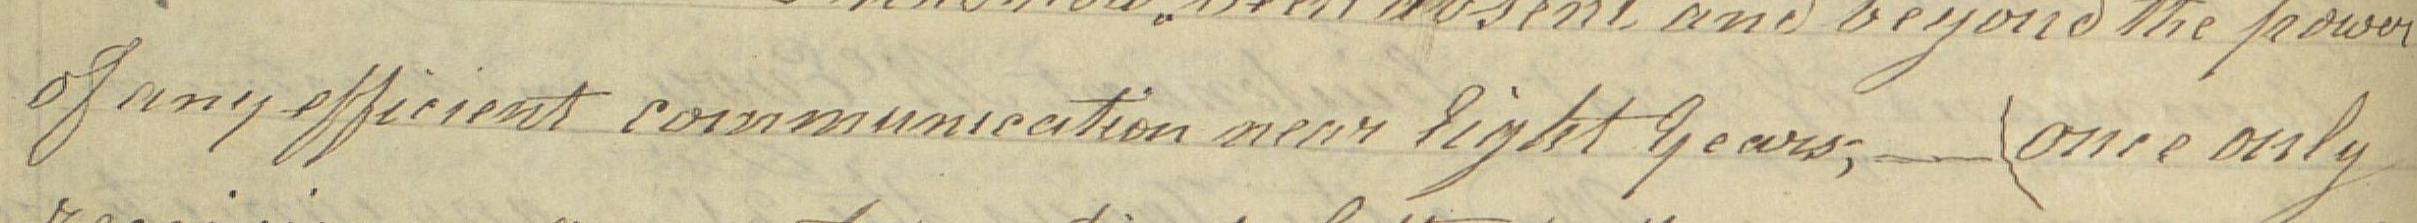of my efficient communication near Eight Years; (once only
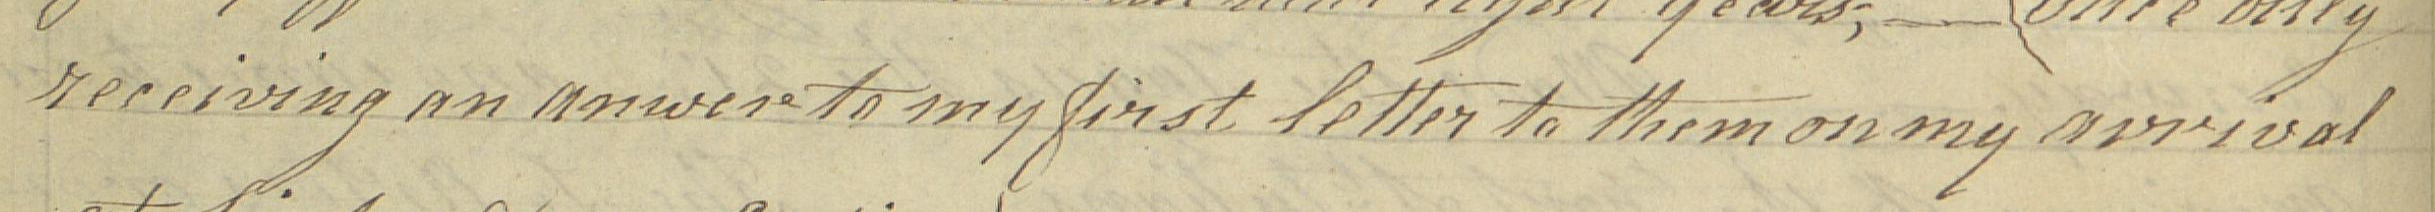receiving an anwer to my first letter to them on my arrival
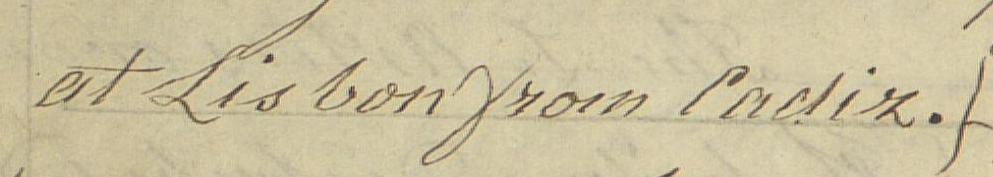at Lisbon from Cadiz.)
